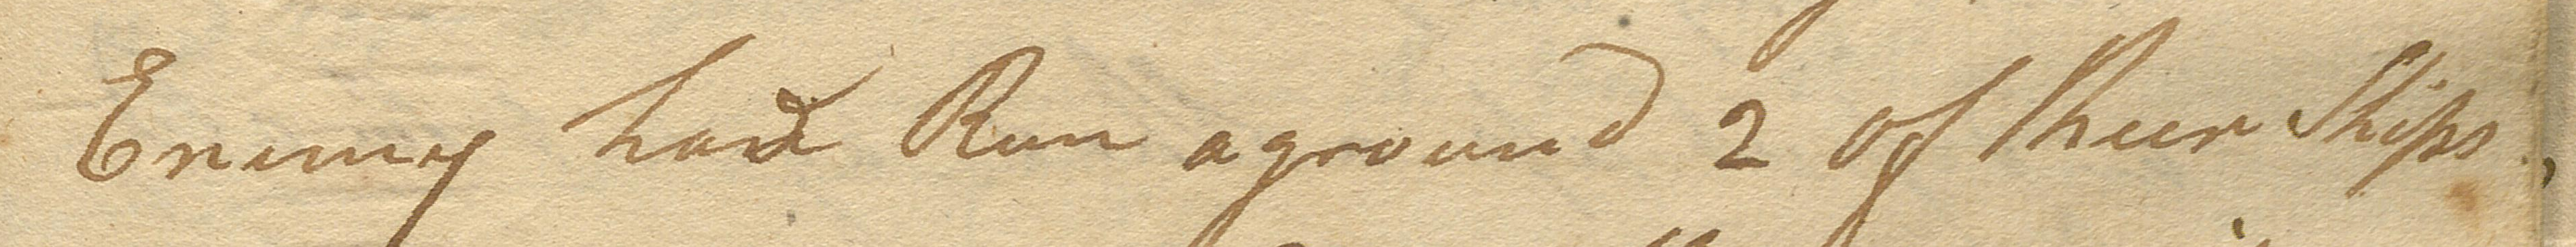Enemy had Run aground 2 of their Ships
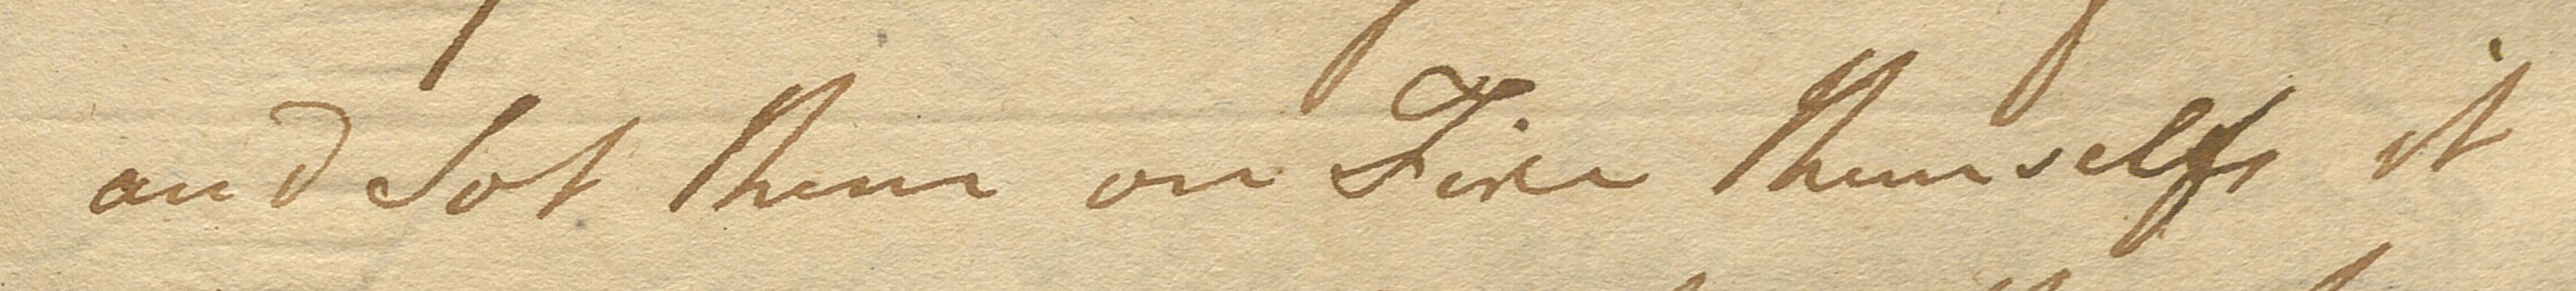and set them on Fire themselfs it
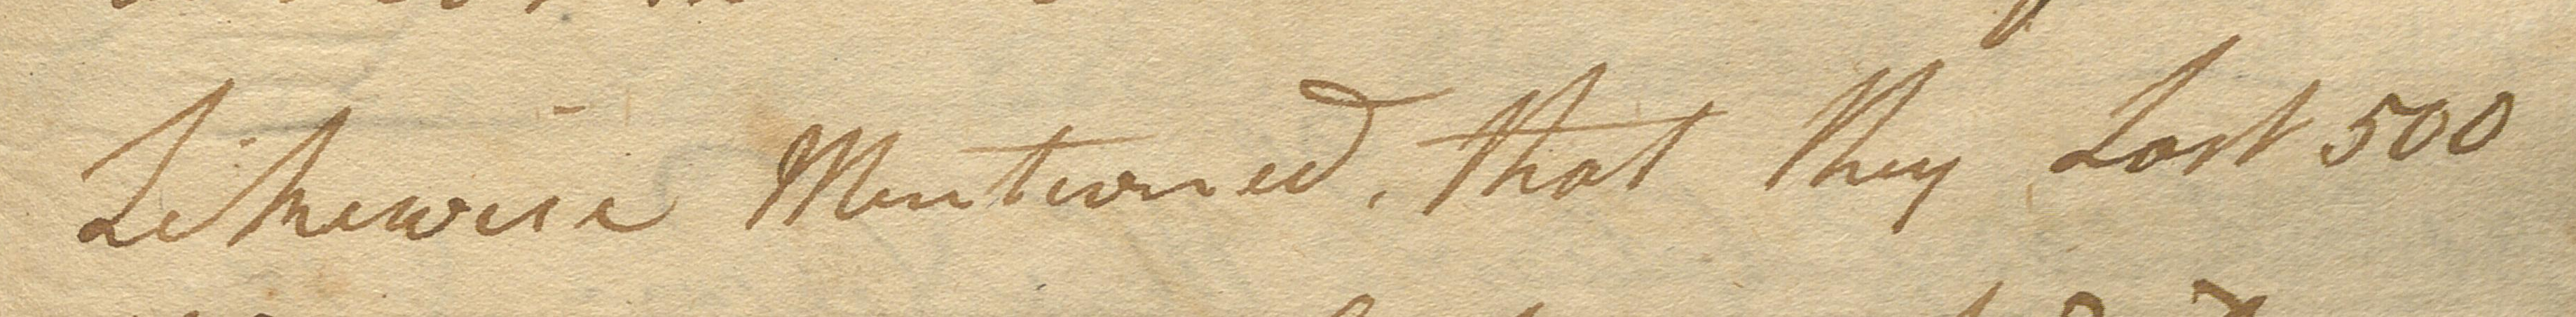Likewise Mentioned that they Lost 500
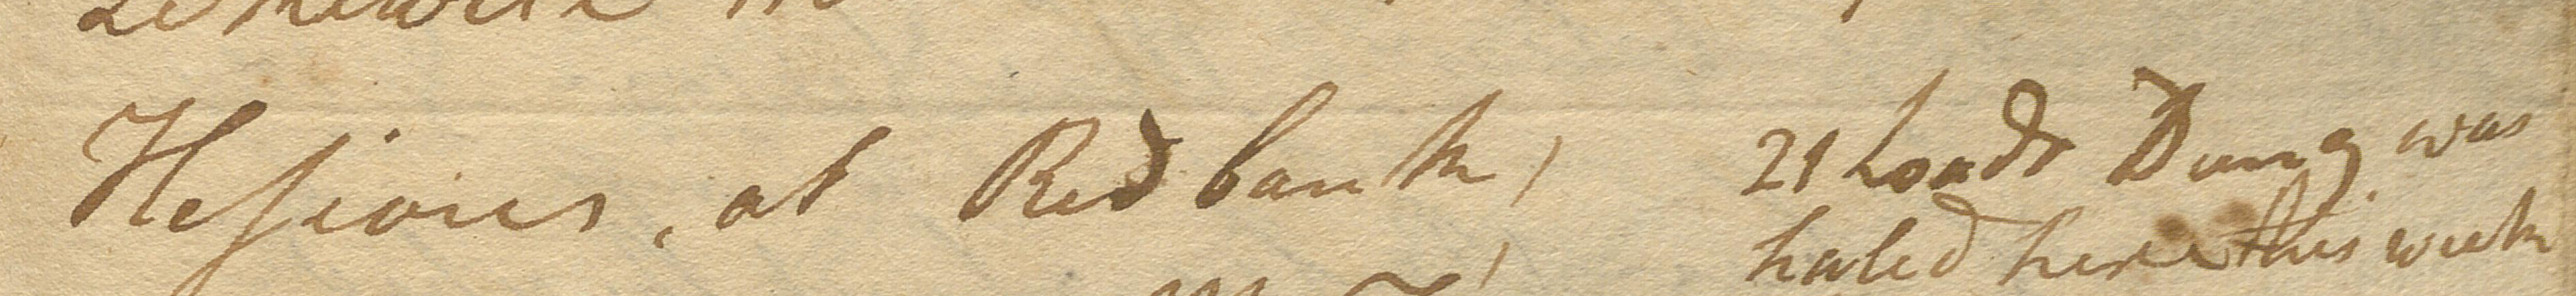Hesians, at Redbank, 21 Loads Dung was
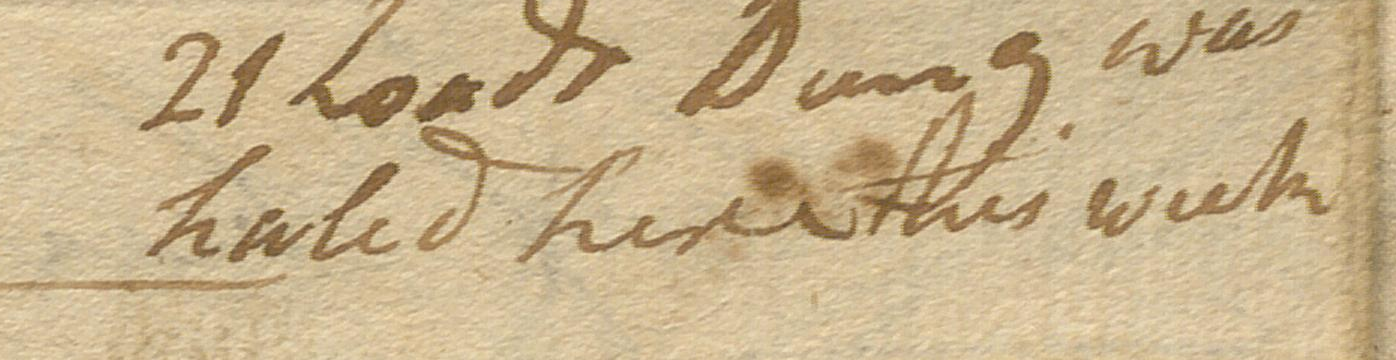haled here this week
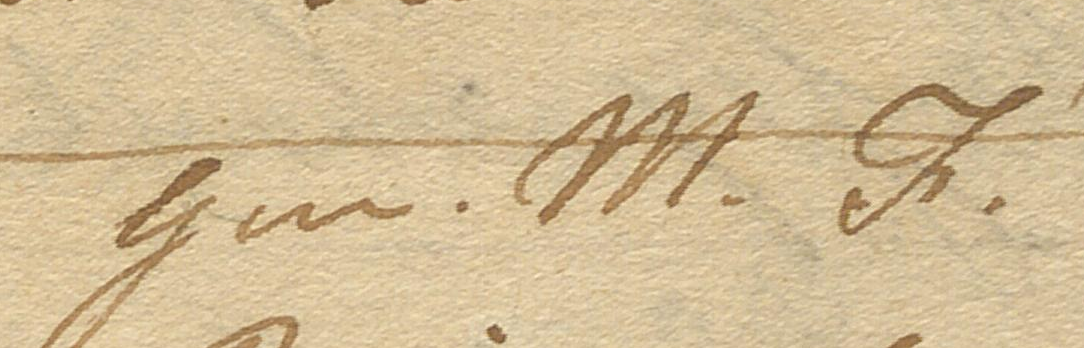Gen. M. F.
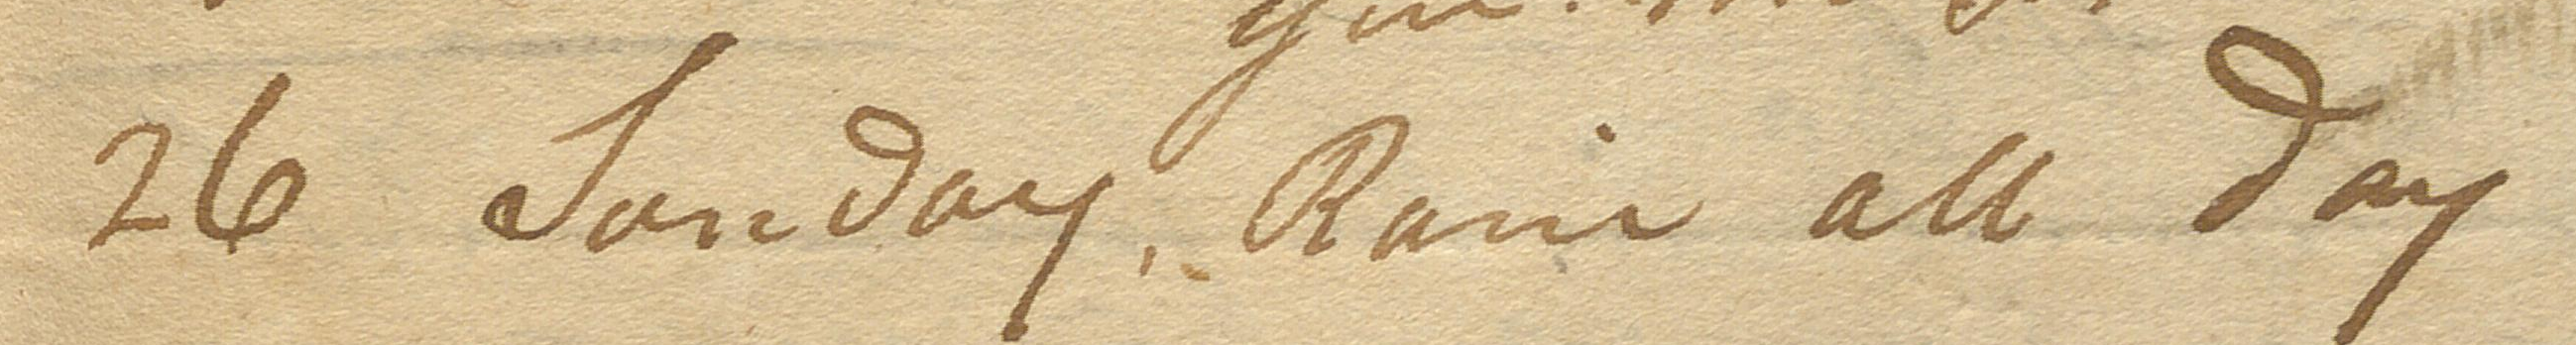26 Sunday. Rain all day
